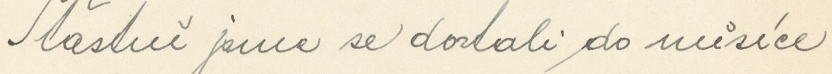Šťastně jsme se dostali do měsíce
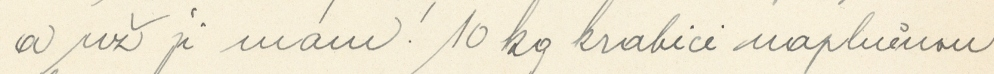a už ji mám! 10 kg krabici naplněnou
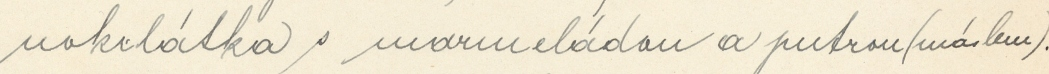nokrlátka s marmeládou a putrou (máslem).
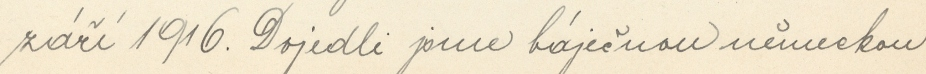září 1916. Dojedli jsme báječnou německou
